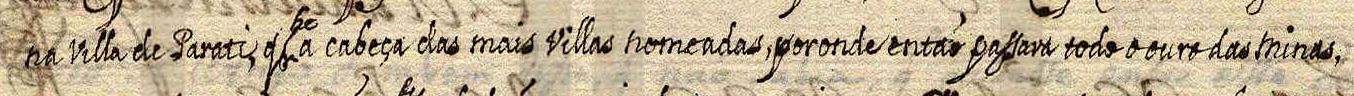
na Villa de Parati, q̄ he a cabeça das mais Villas nomeadas, por onde entaõ passava todo o ouro das minas,
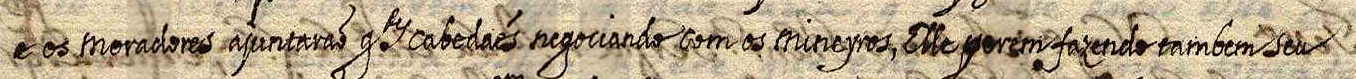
e os moradores ajuntaraõ gdes cabedaẽs negociando com os mineyros, Elle porem fazendo tambem seu
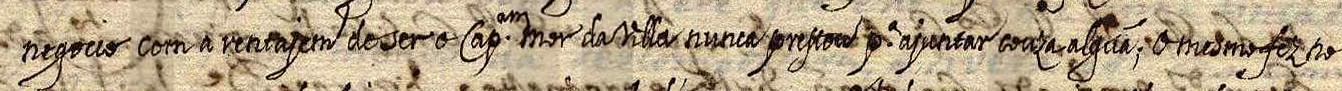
negocio com a ventajem ser o Cap.am mor da Villa nunca prestou p.a ajuntar cousa alguā; o mesmo fez no
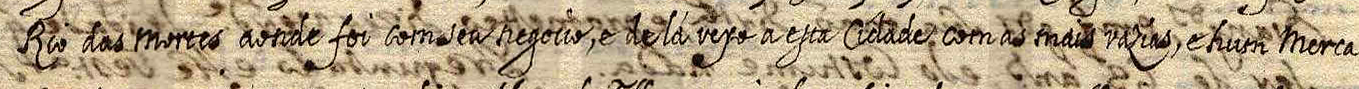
Rio das Mortes aonde foi com seu negocio, e de lá veyo a esta Cidade, com as mais vazias, e hum merca
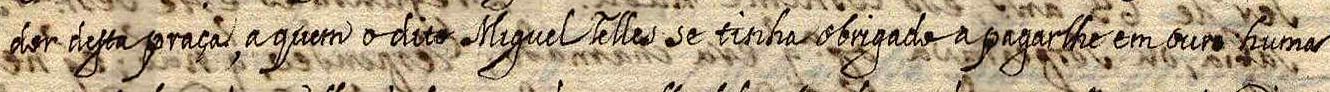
dor desta praça, a quem o dito Miguel Telles se tinha obrigado a pagarlhe em ouro huma
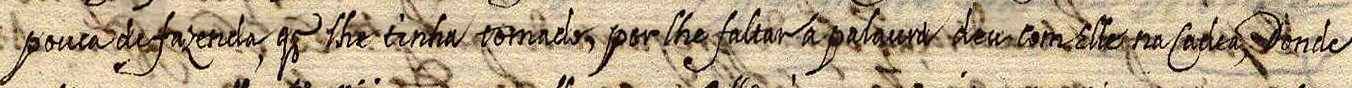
pouca de fazenda, q̄ lhe tinha tomado, por lhe faltar a palaura deu com Elle na Cadea, Donde
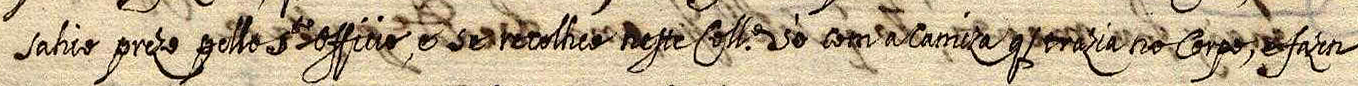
sahio prezo pello sto officio, e se recolheo neste Coll.o só com a camisa q̄ trazia no corpo, e fazen
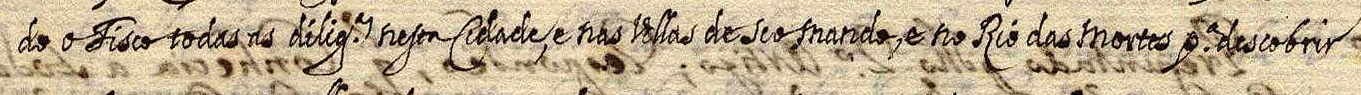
do o Fisco todas as dilig.as nesta Cidade, e nas Villas de seo mando, e no Rio das Mortes p.a descobrir
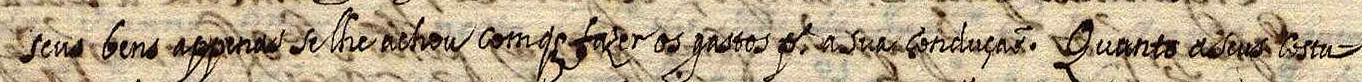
seus bens appenas se lhe achou com q̄ fazer os gastos pa a sua conduçaõ. Quanto a seus costu
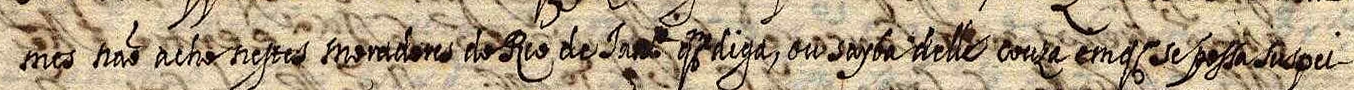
mes naõ acho nestes moradores do Rio de In_.a q̄m diga, ou sayba delle cousa em q̄ se possa suspei
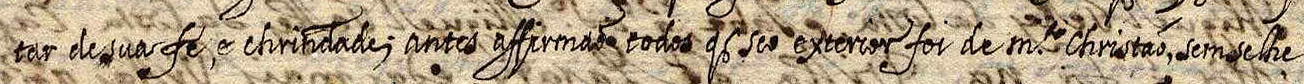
tar de sua fé, e christ̄dade; antes affirmaõ todos q̄ o seo exterior foi de m.to christão, sem se lhe
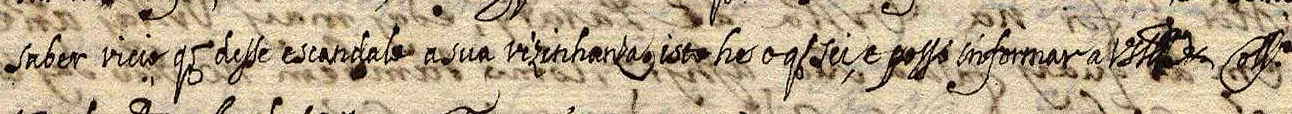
saber vicio q̄ desse escandalo a sua vizinhanza; isto he o q̄ sei, e posso informar VSIll.a Coll.o
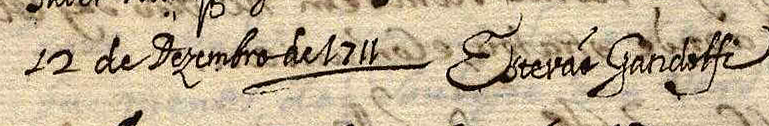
12 de Dezembro de 1711 Estevaõ Gandolfi
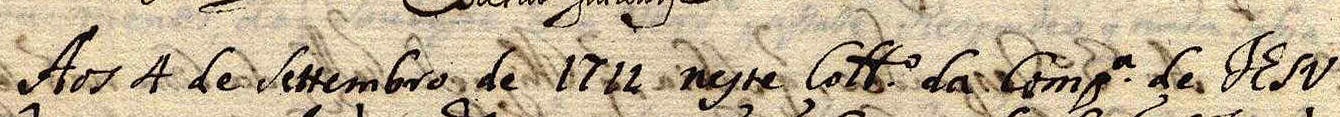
Aos 4 de Settembro de 1711. neste Cott.o da Comp.a de IESV
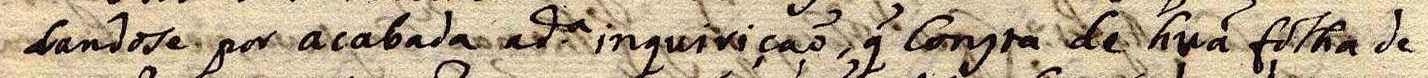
dandose por acabada a d.a inquiriçaõ, q̄ Consta de huā folha de
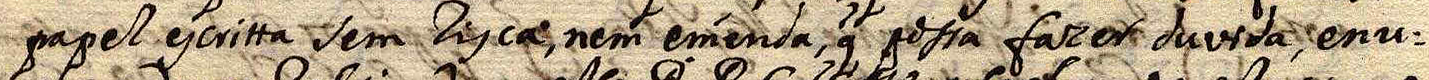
papel escritta sem Risca, nem em̄enda, q̄ possa fazer duvida; enu
